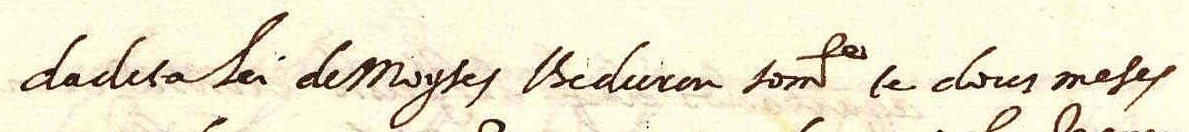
da dita lei de Moyses lhe durou somte te dous meses
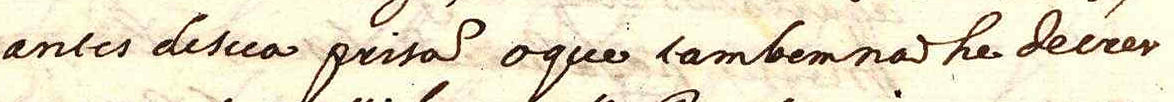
antes de sua prisaõ o que tambem naõ he de crer
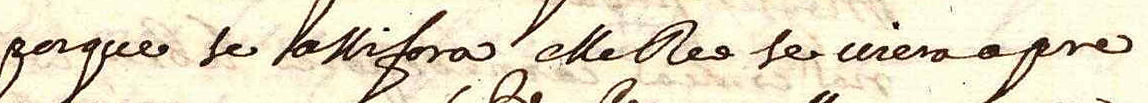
porque se assi fora elle Reo se uiera apre
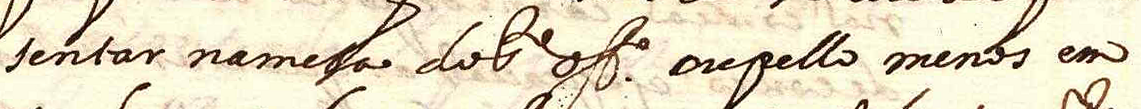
sentar na messa do sto off.o ou pello menos em
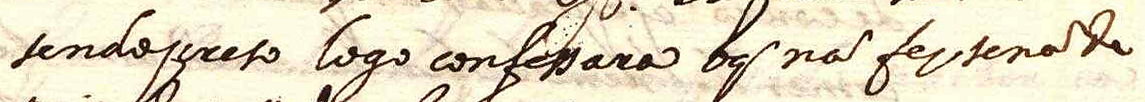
sendo preso logo confessara o q̄ naõ fez se naõ de
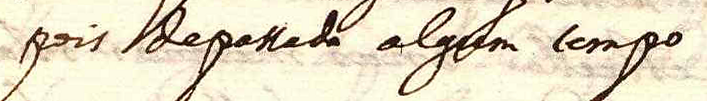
pois de passado algum tempo
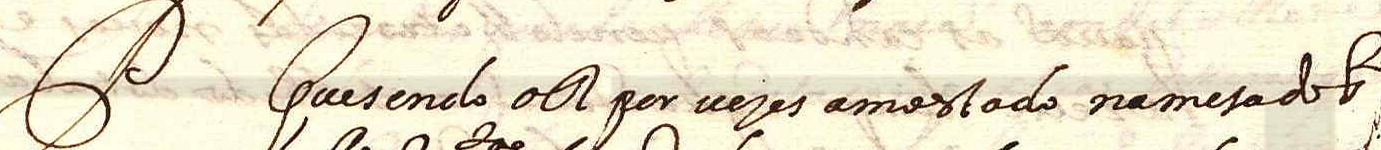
P Que sendo o R por uezes amoestado na mesa do sto
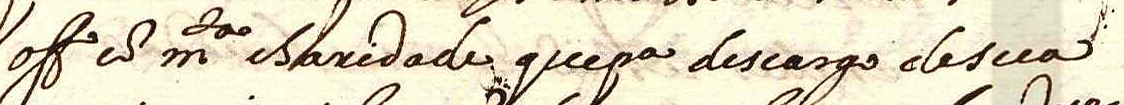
offo cō mta charidade que pa descargo de sua
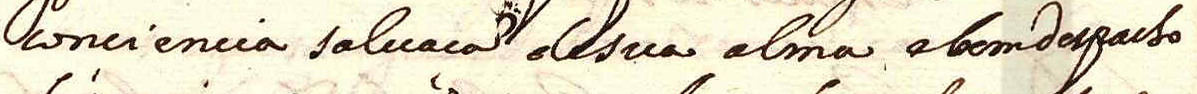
conciencia saluaçaõ de sua alma e bom despacho
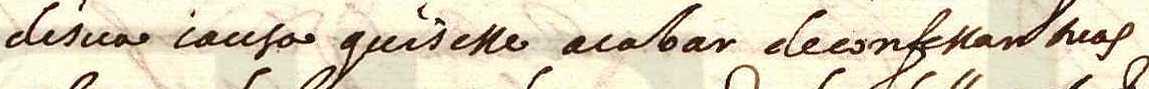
de sua causa quisesse acabar de confessar suas
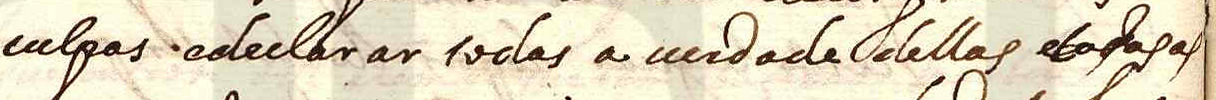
culpas e declarar todas a uerdade dellas e todas as
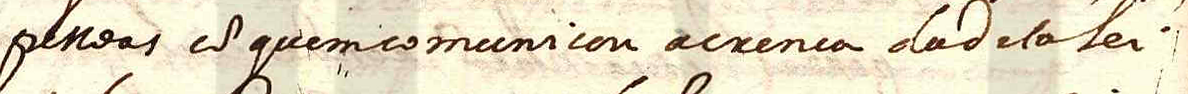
pessoas cō quem comunicou a crença da dita lei
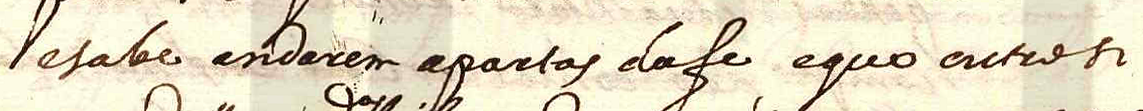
e sabe andarem apartas da fe e que outrosi
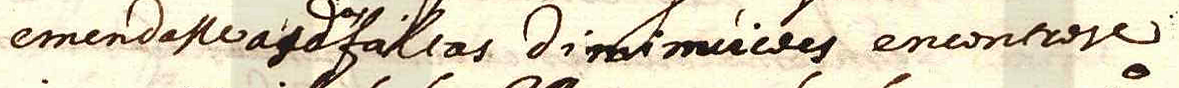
emendasse as das faltas diminuiçoes encontros e
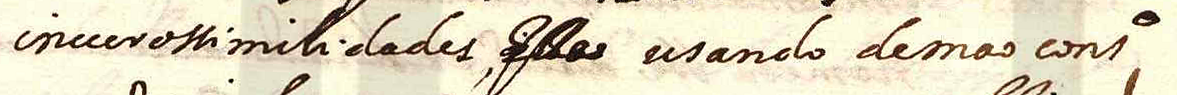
inuerossimilidades, Elle usando de mao conso
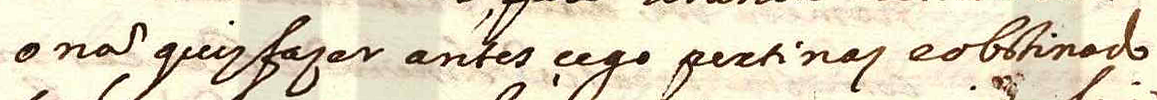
o naõ quiz fazer antes cego pertinaz e obstinado
